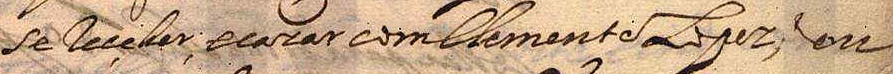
se reçeber, e cazar com Clemente Lopez, e em
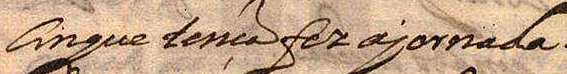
con que tençaõ fez a jornada?
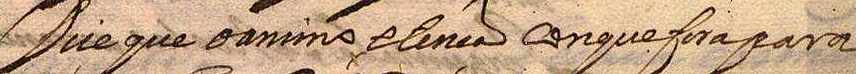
Diçe que o animo, e tençaõ con que fora para
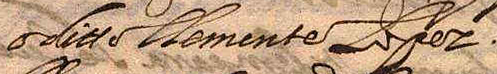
o ditto Clemente Lopez.
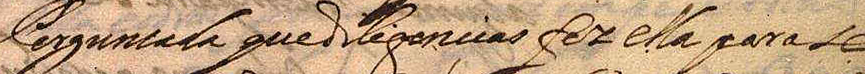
Perguntada que diligençias fez ella para se
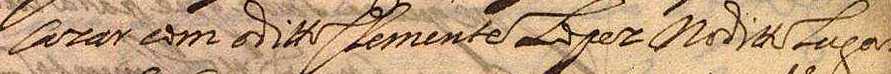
cazar com o ditto Clemente Lopez no ditto Lugar
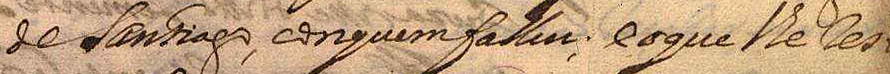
de SanTiago, con quem fallou; e o que lhe Res
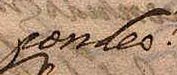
pondeo?
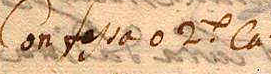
Confessa o 2.o Ca=
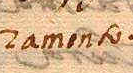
zamento.
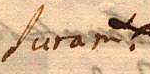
Iuram.to
